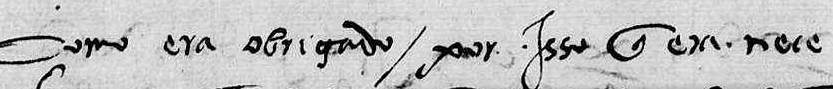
Como era obrigado / por Jsso q̄ era nece
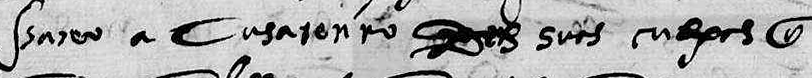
ssareo aCusarenno das suas culpas q̄
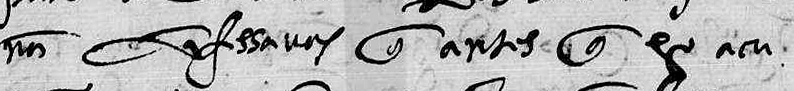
nā Cōfessaua / q̄ antes q̄ ho acu
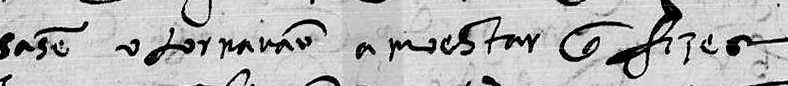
sasē o tornauaõ amoestar q̄ fizese
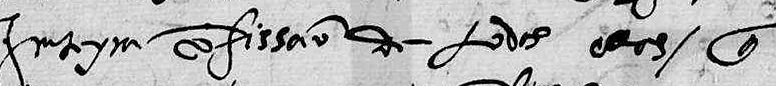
Jmteyra cōfissaõ de todas ellas / q̄
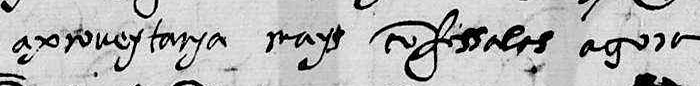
aproueytarya mays cōfessalas agora
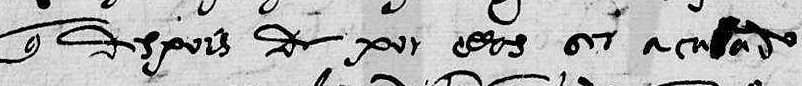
q̄ despois de por ellas ser acu_ado
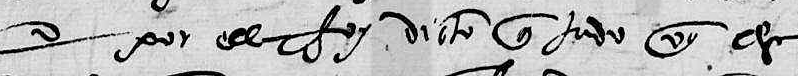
e por elle foy dictō q̄ tudo o q̄ lhe
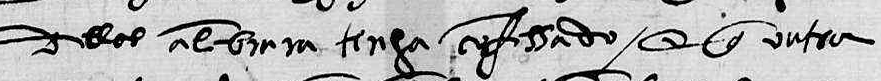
dellas alēbrara tinha cōfessado / e q̄ outra
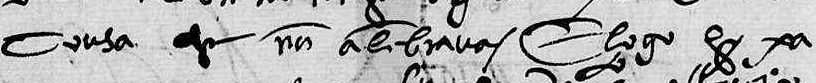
Cousa lhe nā alēbraua / E logo hy pa
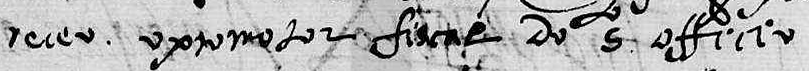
receo o promotor fiscal do sto officio
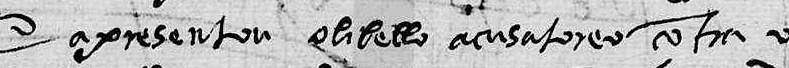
e apresentou o libello acusatoreo cōtra o
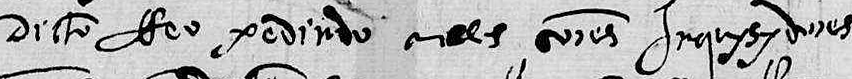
dicto Reo pedindo a elles sōres Jnquysydores
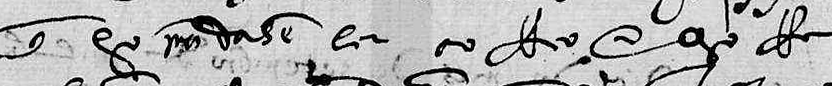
q̅ ho mādasē ler ao Reo e lho Re
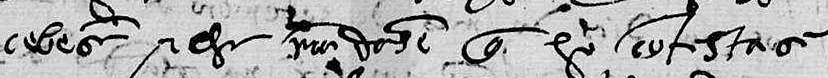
cebesē e lhe mādasē q̅ ho cōtestase
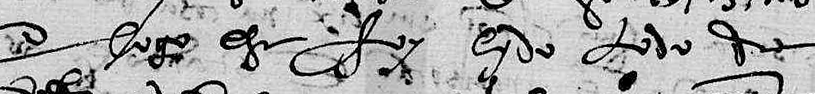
e logo lhe foy lydo todo do
